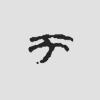于
